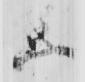之
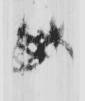相
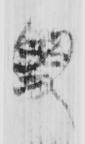受
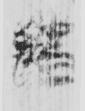既
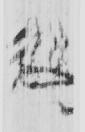巡
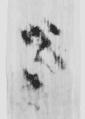水
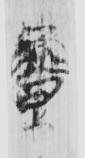{雨旱}
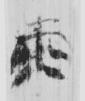雨
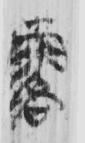{雨各}
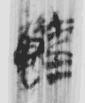既
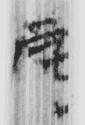厇
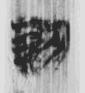則
